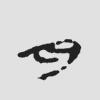月
